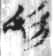利（利）
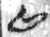㠯（以）
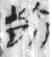折（製）
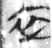衣
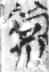○（裳）
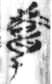○（貌）
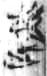○（麗）
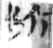折（製）
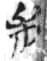布
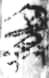○（葛）
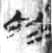爲
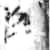門
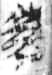膚
